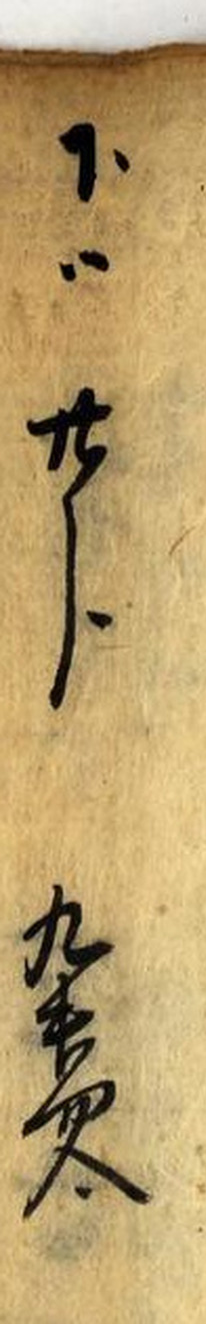同廿分九升四合同人
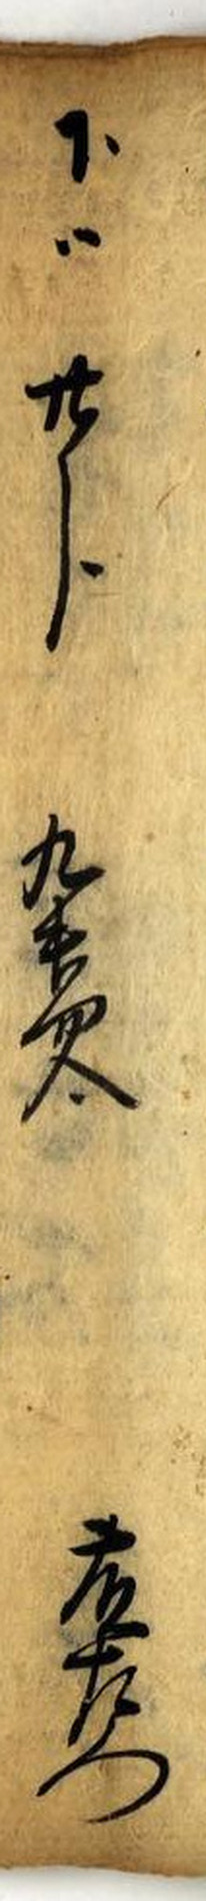下同廿分九升四合藤左衛門
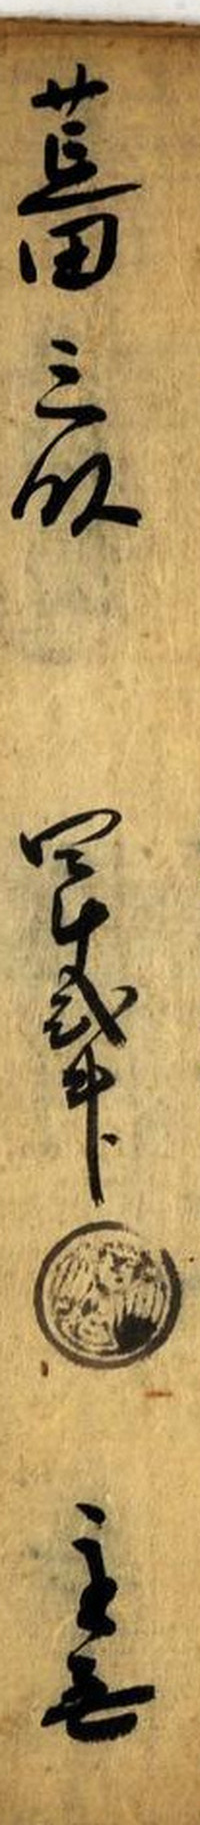荒田三畝四斗弐升㊞主無
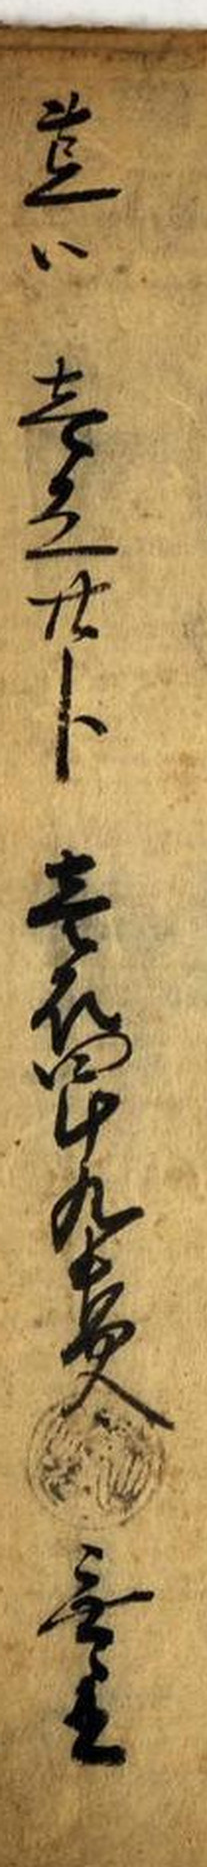荒同壱反廿分壱石四斗九升四合㊞主無
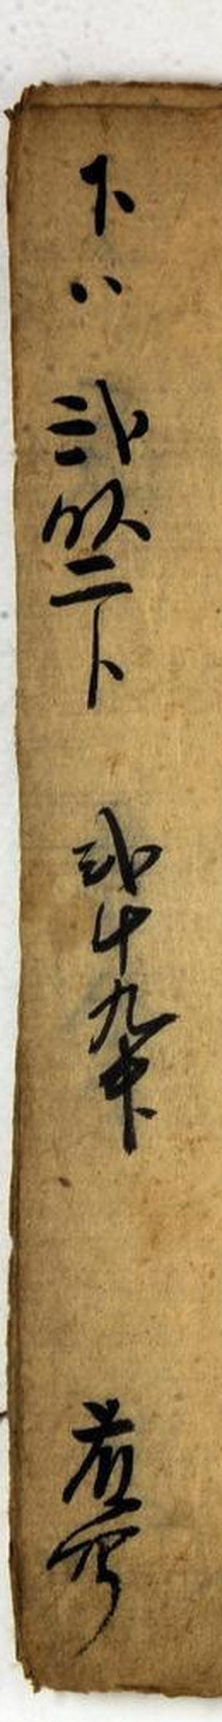下同弐畝二分弐斗九升藤四郎

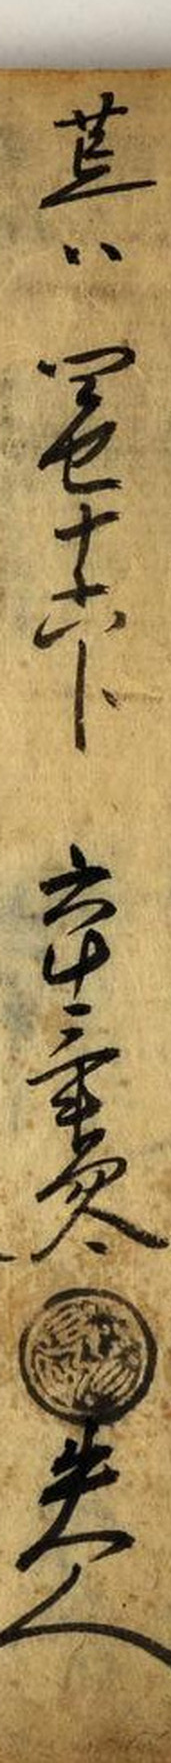荒同四セ十六分六斗三升四合㊞失人
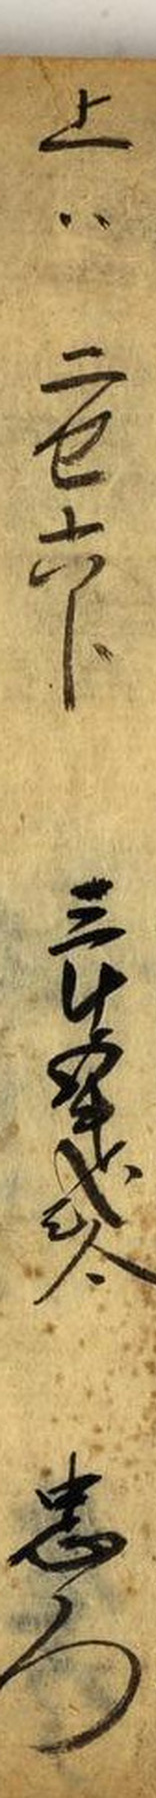上同二セ六分三斗五升弐合忠右衛門
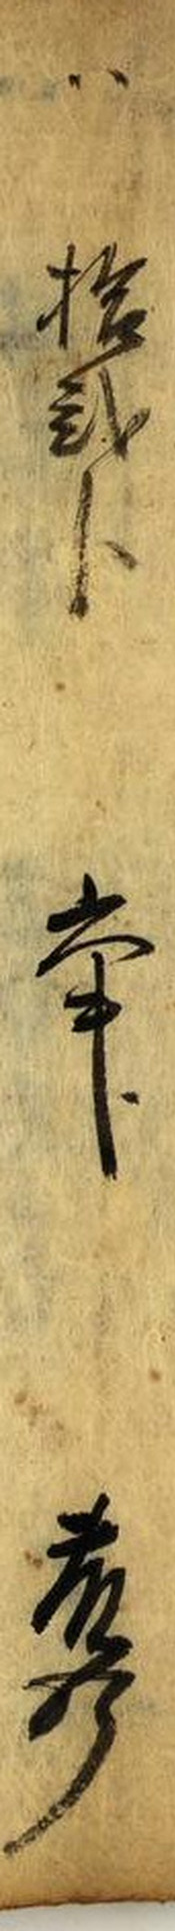同拾弐分六升藤五郎
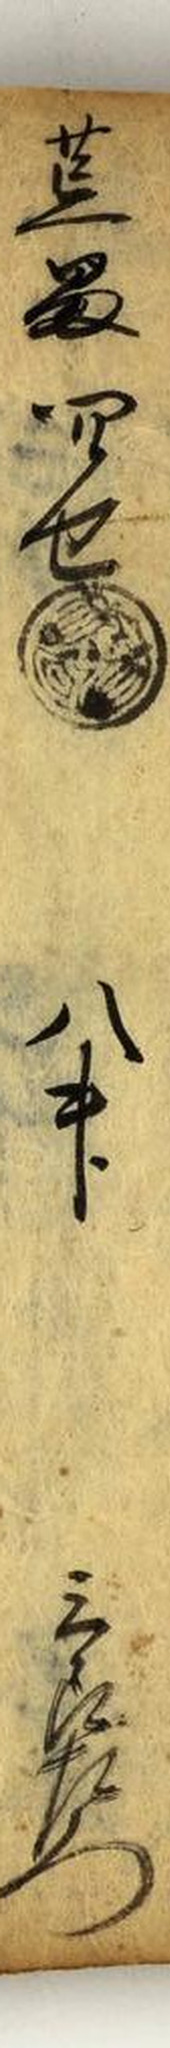荒畠四セ㊞八升三郎左衛門
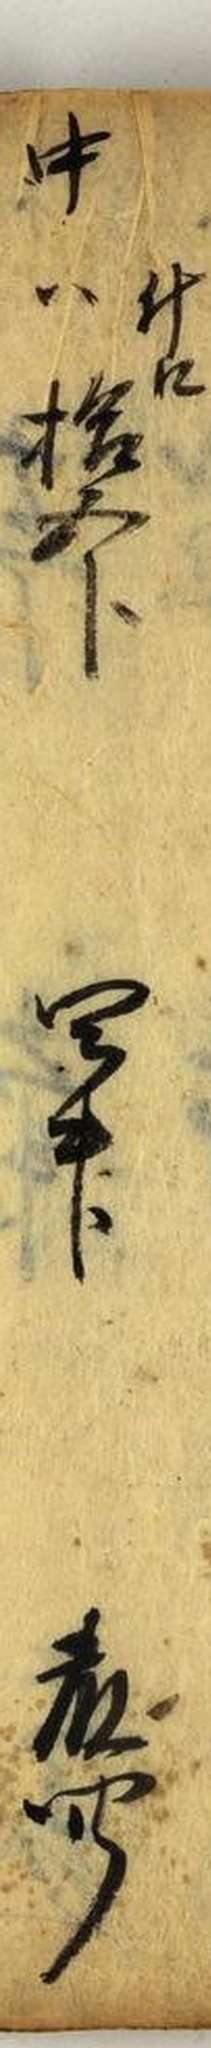中同拾五分四升藤四郎
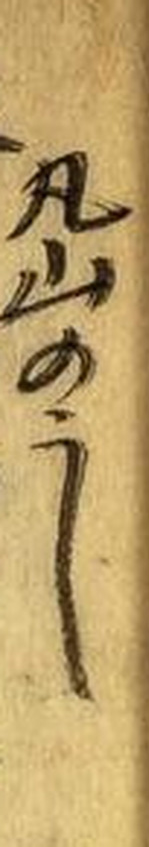丸山のこし
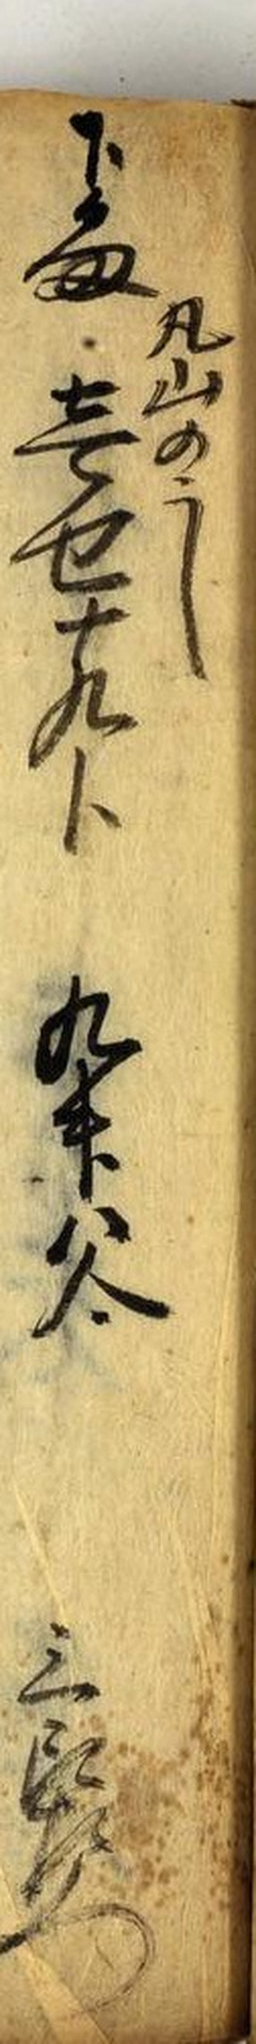下畠壱セ十九分九升八合三郎左衛門
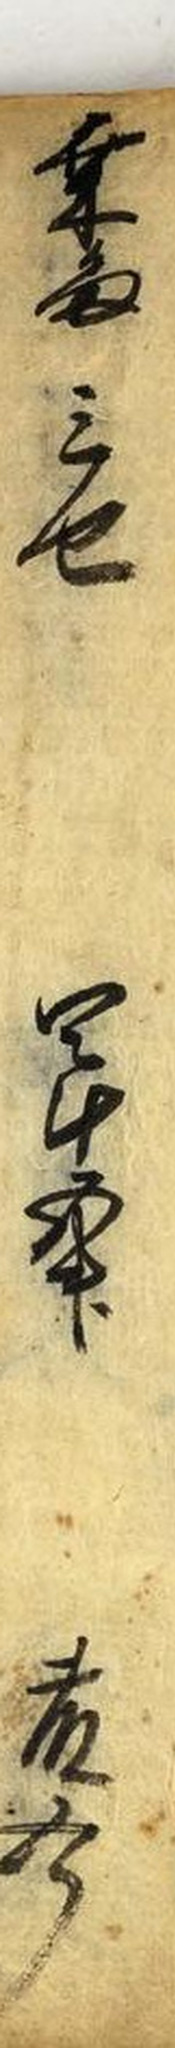桑畠三セ四斗五升藤五郎
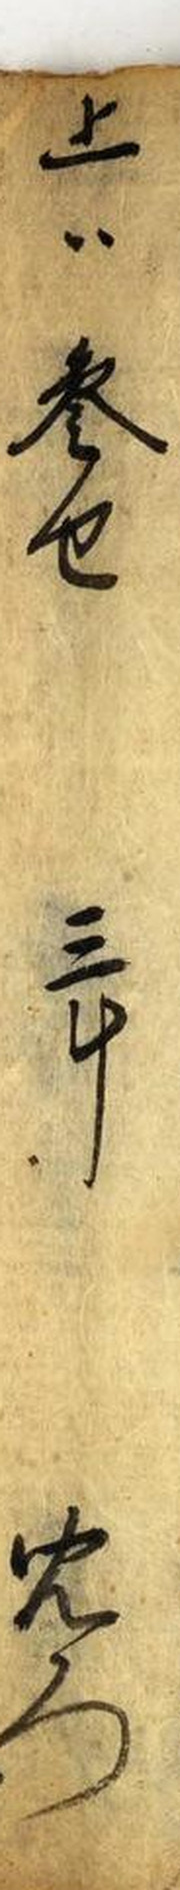上同参セ三斗忠右衛門
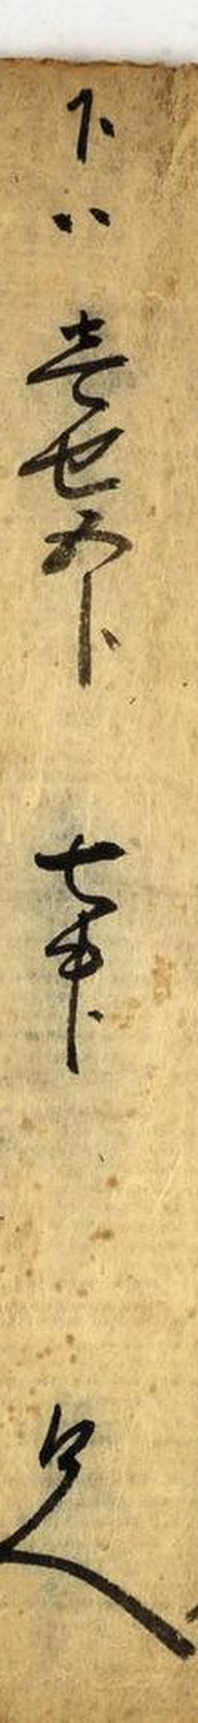下同壱セ五分七升同人
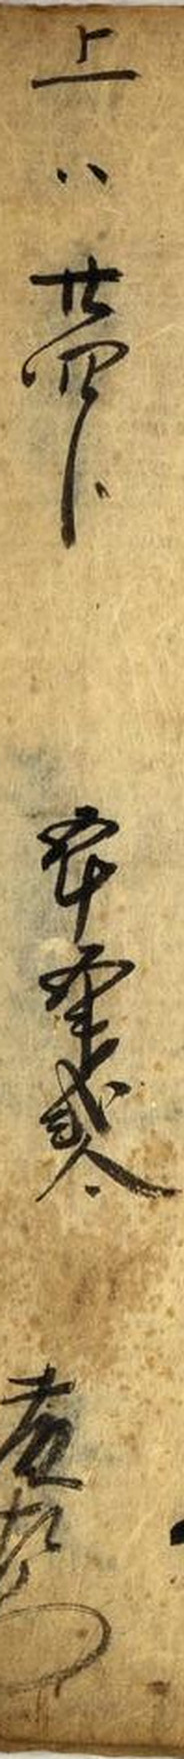上同廿四分五斗五升弐合藤左衛門
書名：越前国西方内志津庄内本折村御検地帳
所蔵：福井県文書館 Fukui Prefectural Archives
